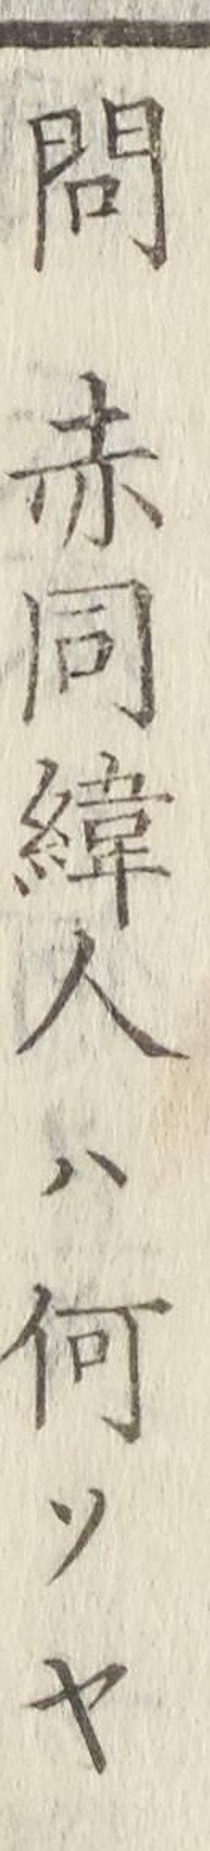問赤同緯人ハ何ソヤ
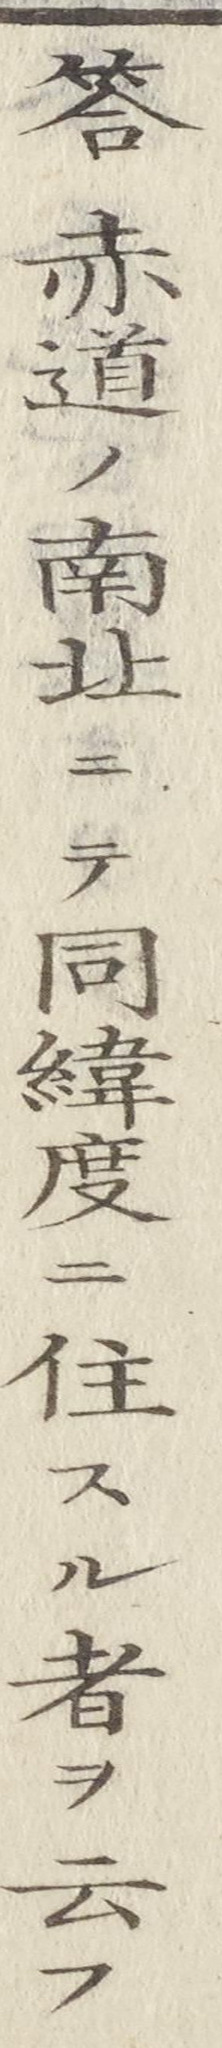答赤道ノ南北ニテ同緯度ニ住スル者ヲ云フ
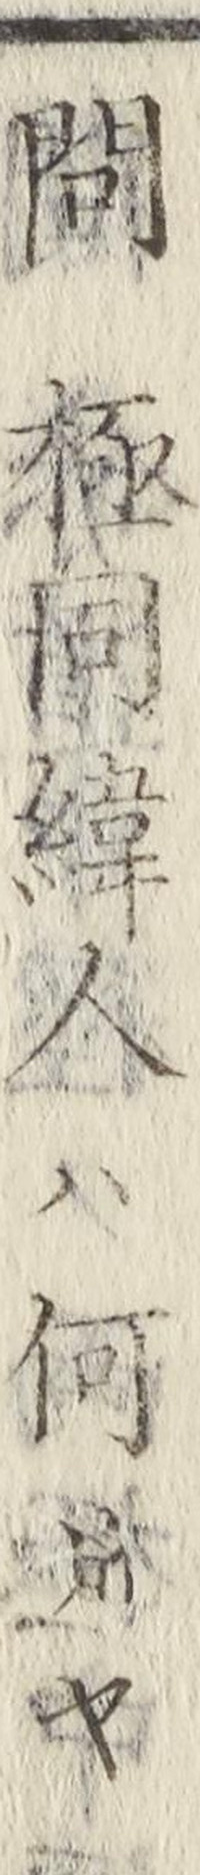問極同緯人ハ何ソヤ
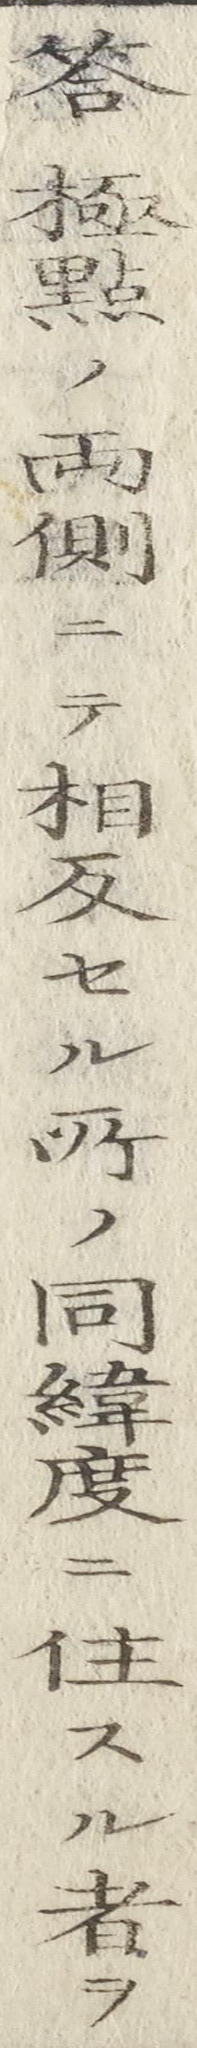答極点ノ両側ニテ相反セル所ノ同緯度ニ住スル者ヲ
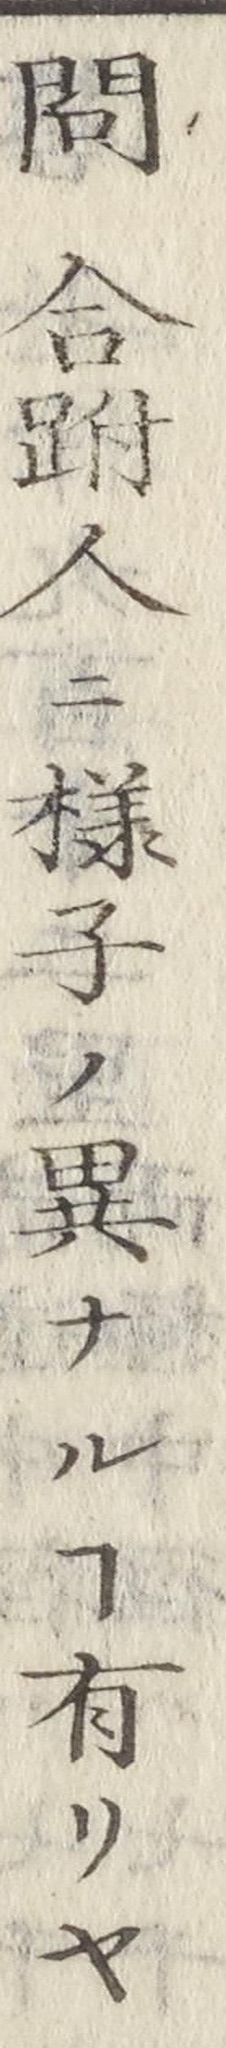問合跗人ニ様子ノ異ナルコト有リヤ
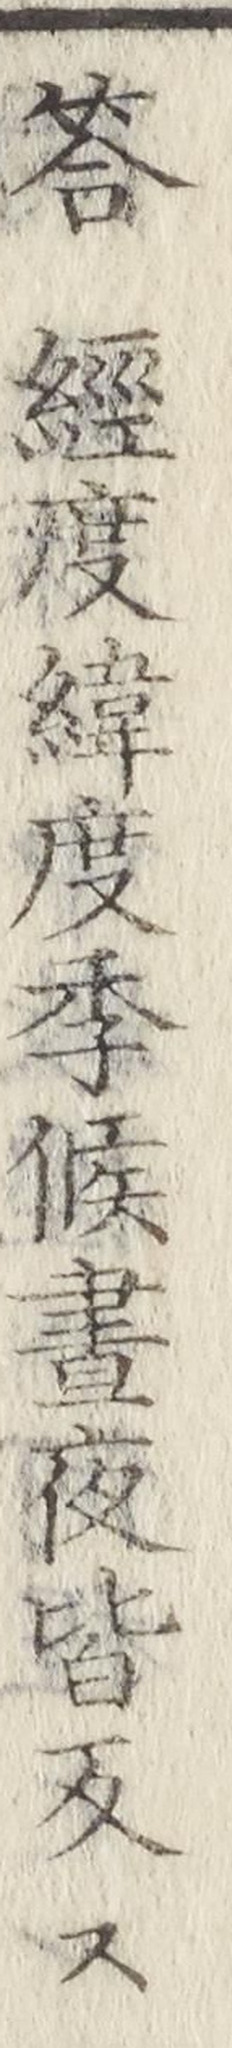答経度緯度季候昼夜皆反ス
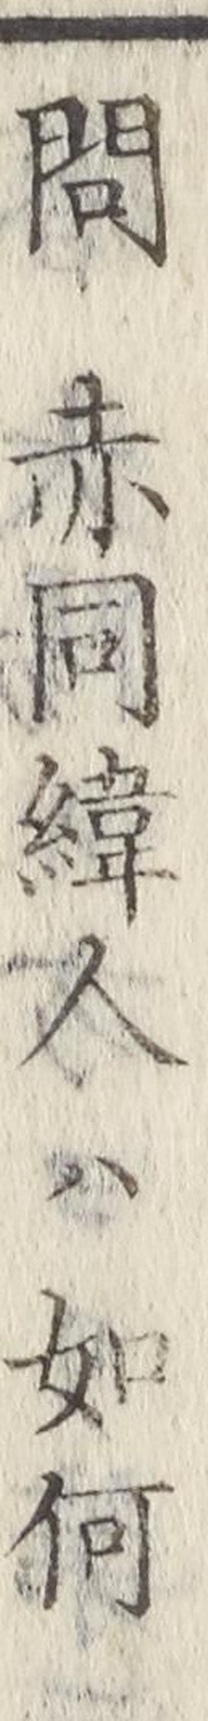問赤同緯人ハ如何
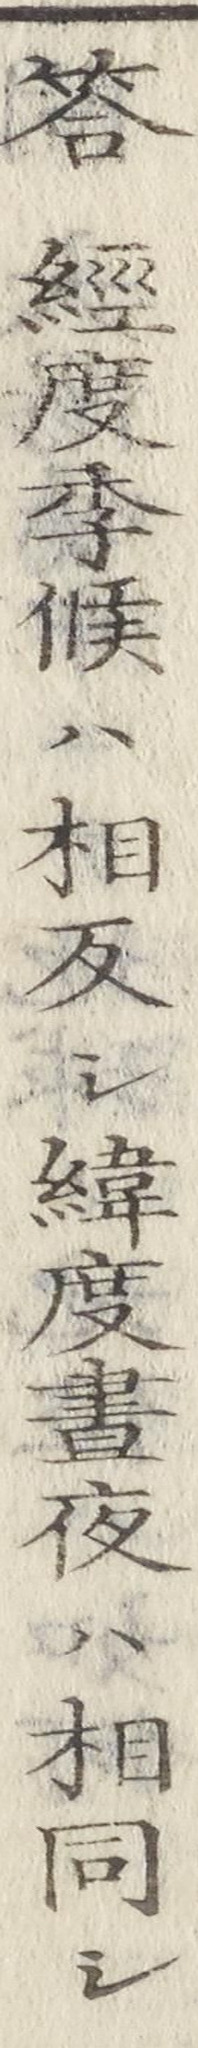答経度季候ハ相反シ緯度昼夜ハ相同シ
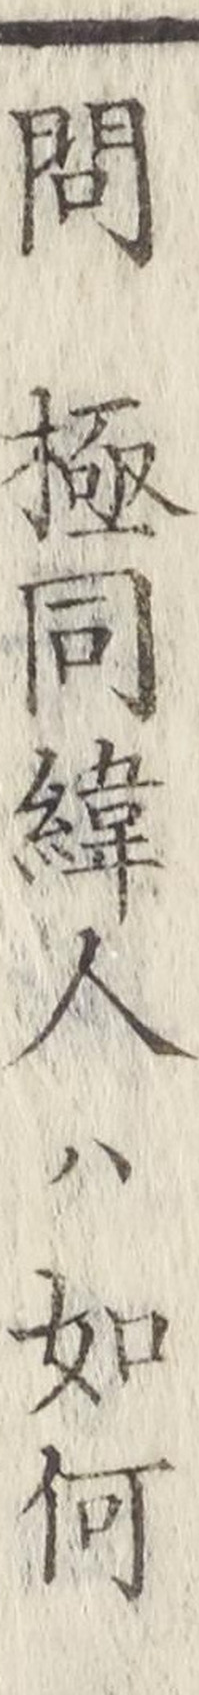問極同緯人ハ如何
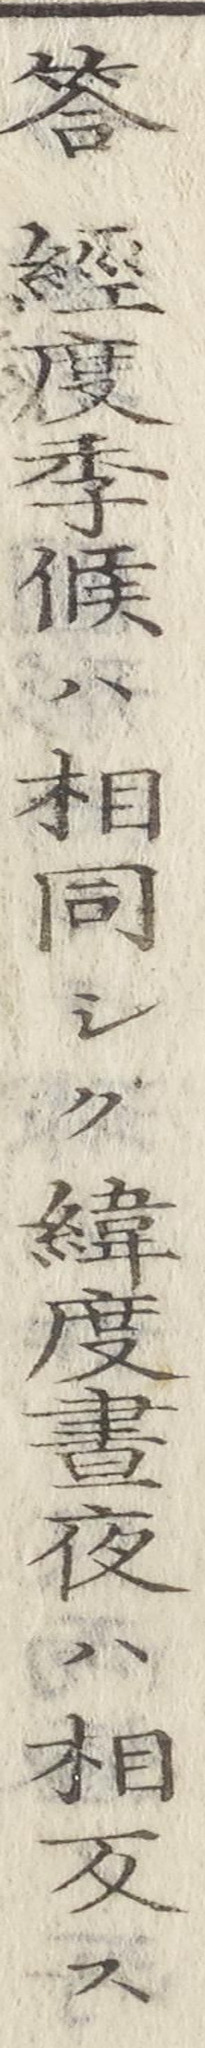答経度季候ハ相同シク緯度昼夜ハ相反ス
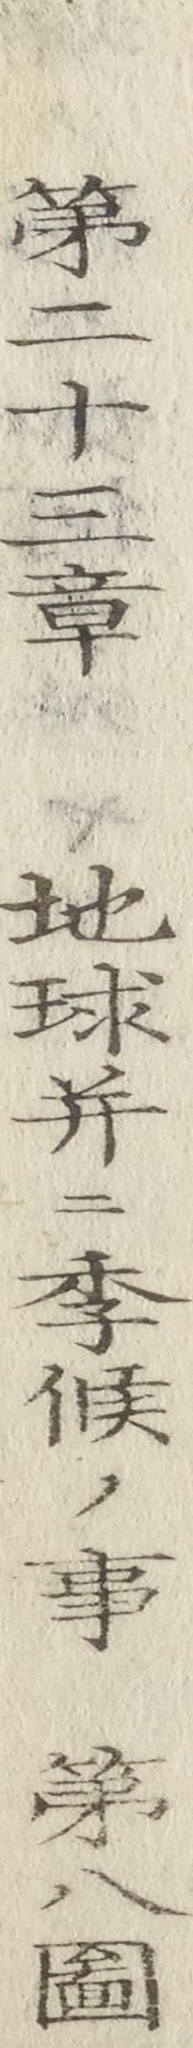第二十三章地球幷ニ季候ノ事第八図

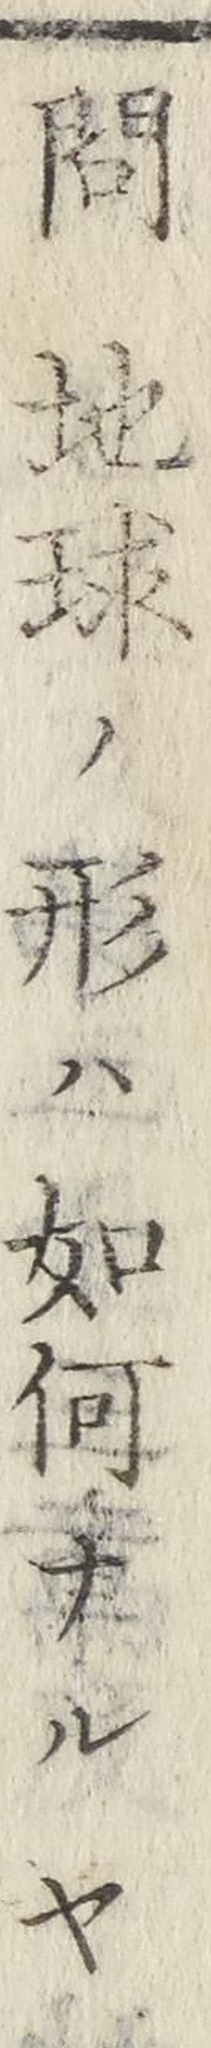問地球ノ形ハ如何ナルヤ
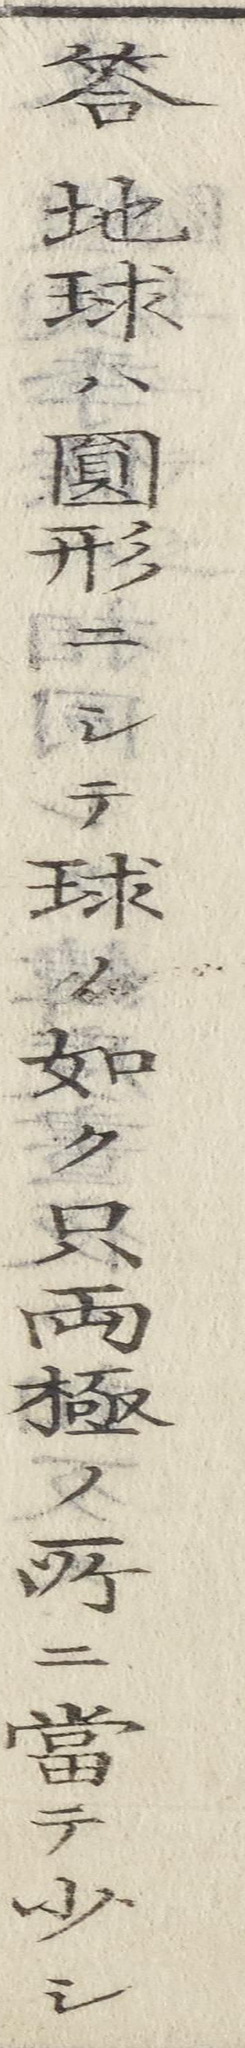答地球ハ円形ニシテ球ノ如ク只両極ノ所ニ当テ少シ
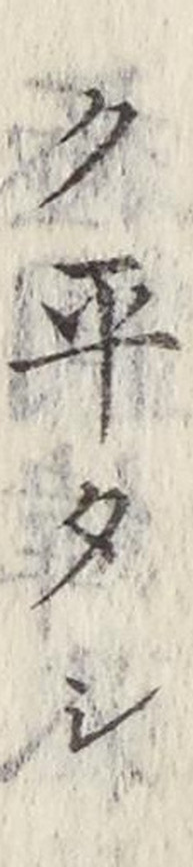ク平タシ
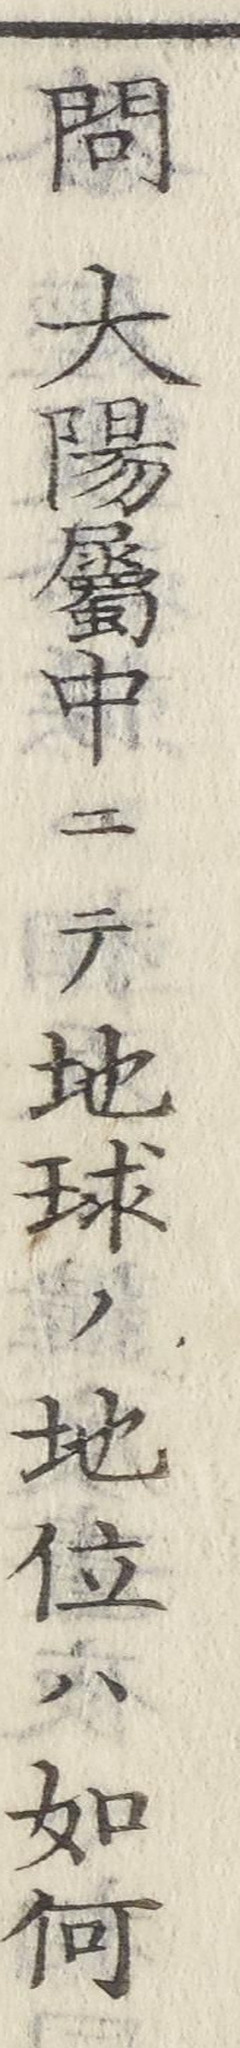問大陽属中ニテ地球ノ地位ハ如何
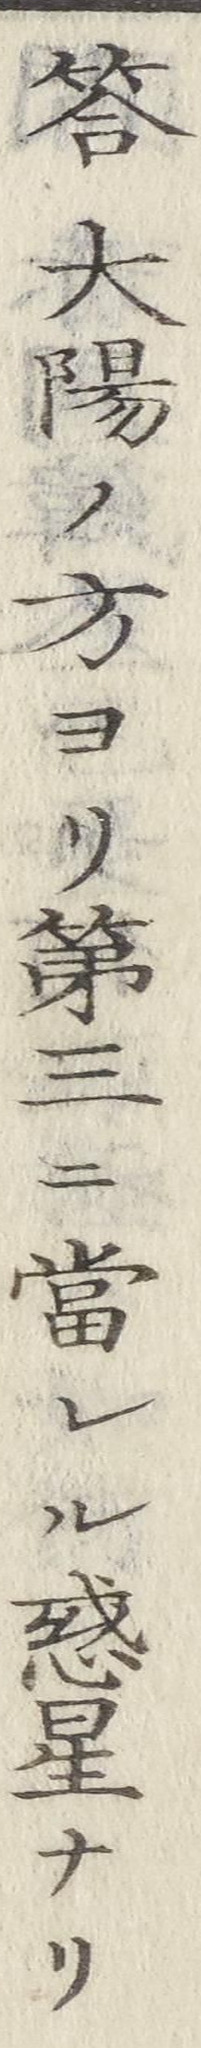答大陽ノ方ヨリ第三ニ当レル惑星ナリ
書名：星学圖説　上
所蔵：東京大学地震研究所図書室 Earthquake Research Institute Library, The University of Tokyo, JAPAN
